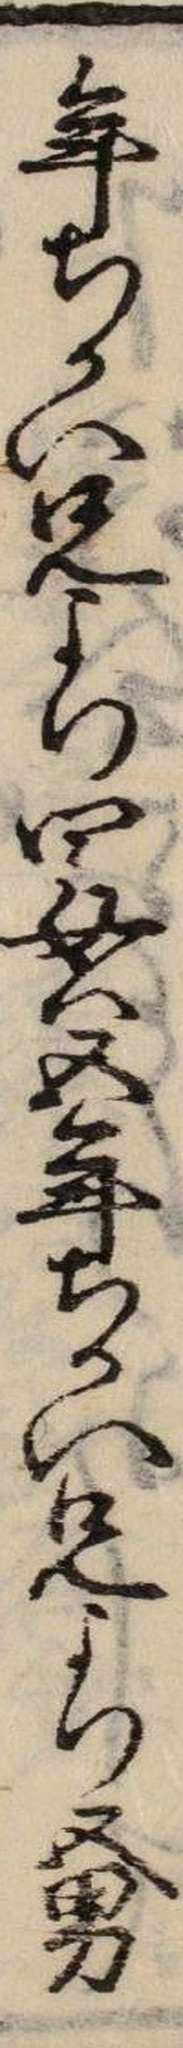年ちかい兄より四女は五年ちかい兄より五男
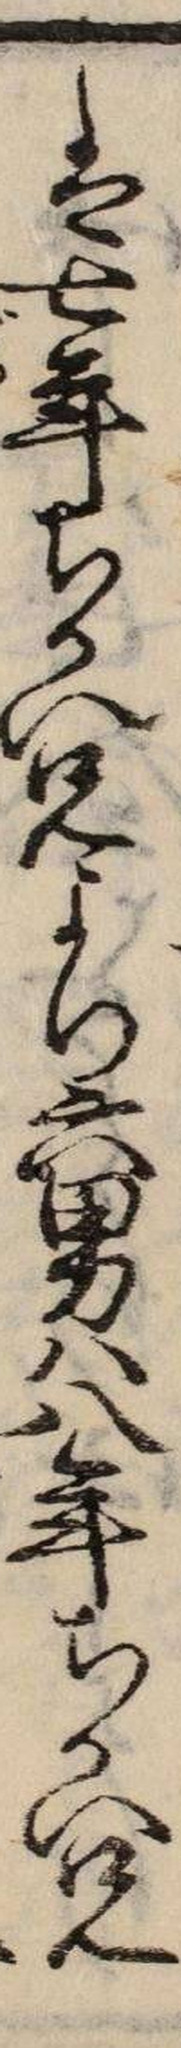は七年ちかい兄より六男は八年ちかい兄
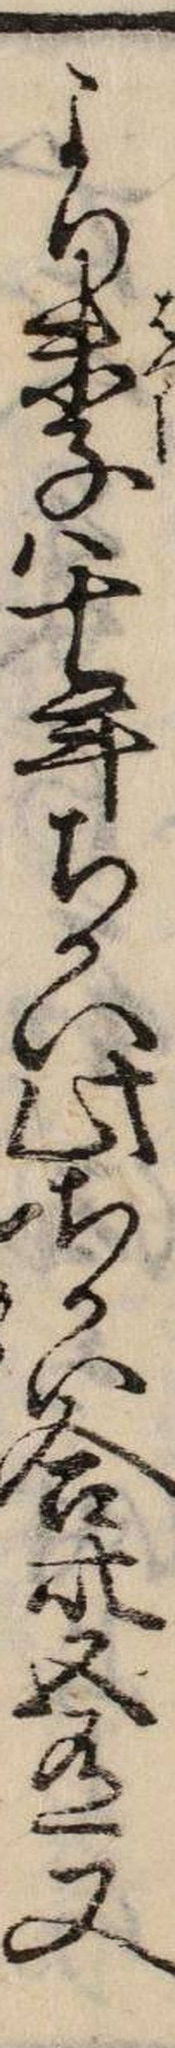より末子は十年ちかい此ちかい合卅五有又
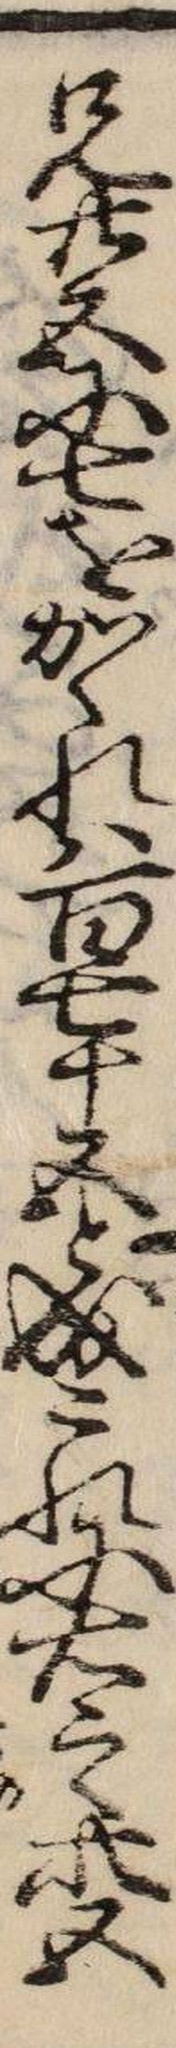兄廿五に七をかくれは百七十五と成これに右之卅五
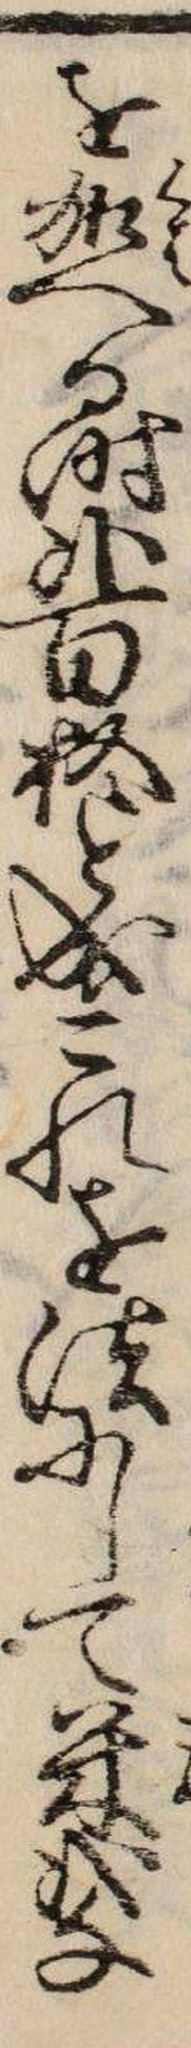を加へる時弐百拾と成これを法にして米弐千
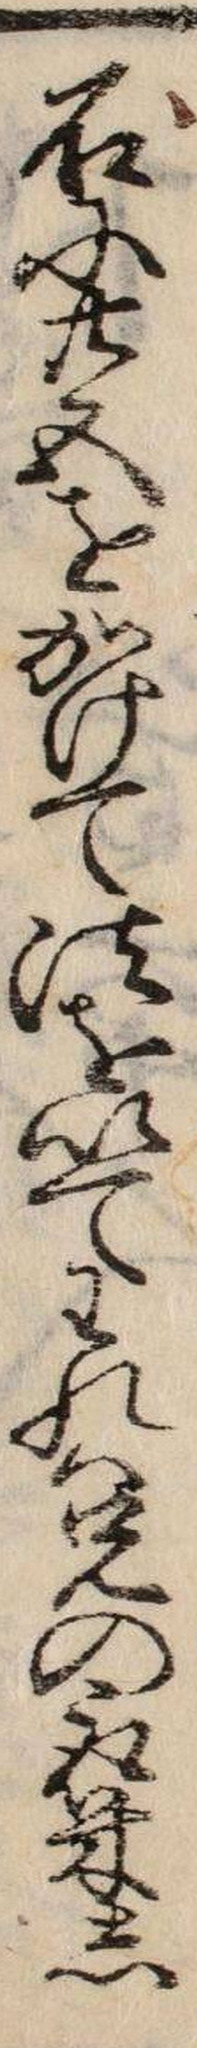石に廿五をかけて法を以てわれは兄の取米し
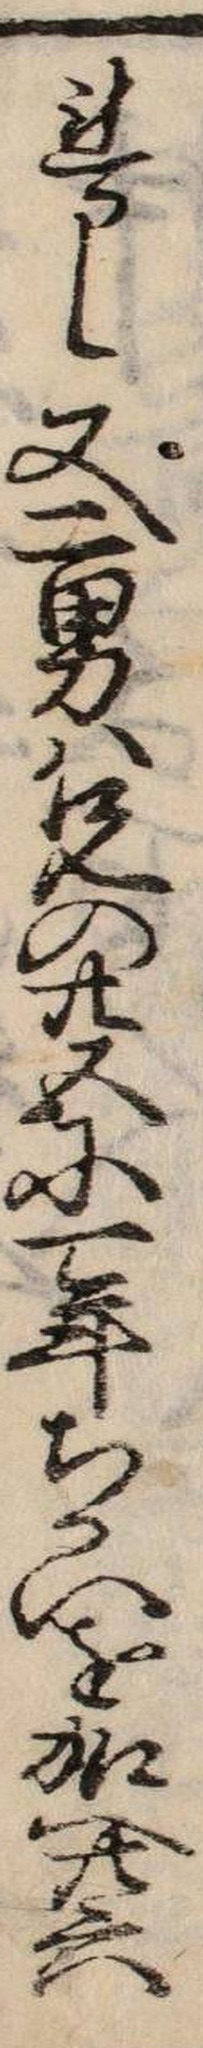れ申候又二男は兄の廿五に一年ちかいを加へ廿六
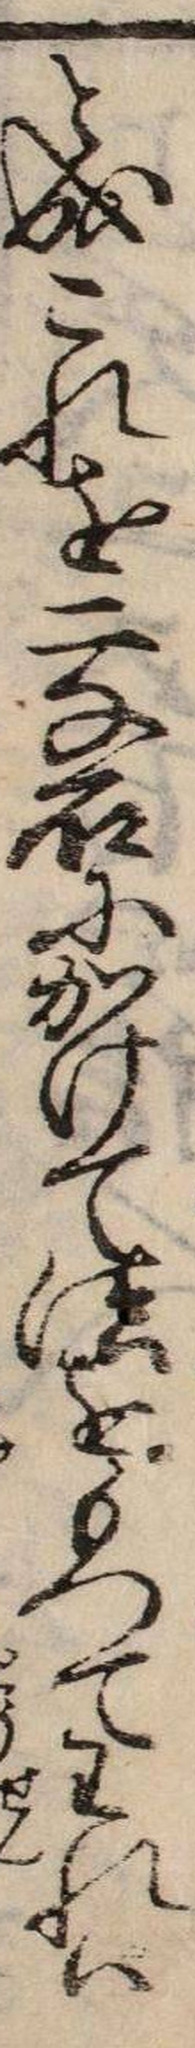と成これを二千石にかけて法をもつてわれは
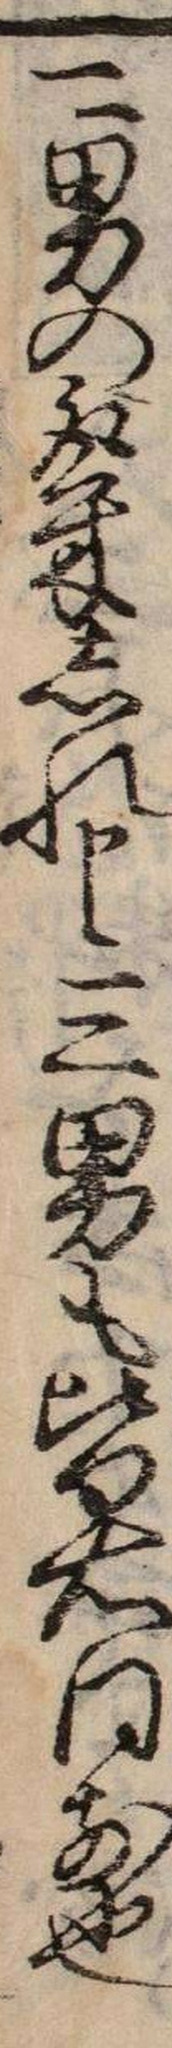二男の取米しれ申候三男も皆右同前也

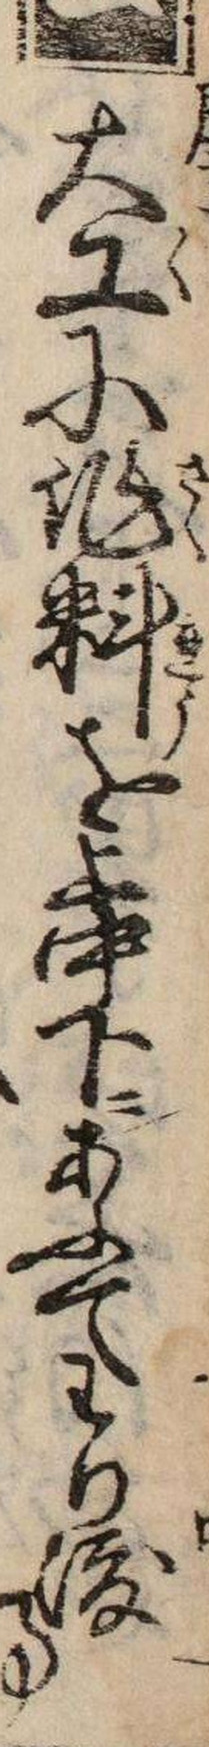第二大工に作料を上中下にあふてわり渡事
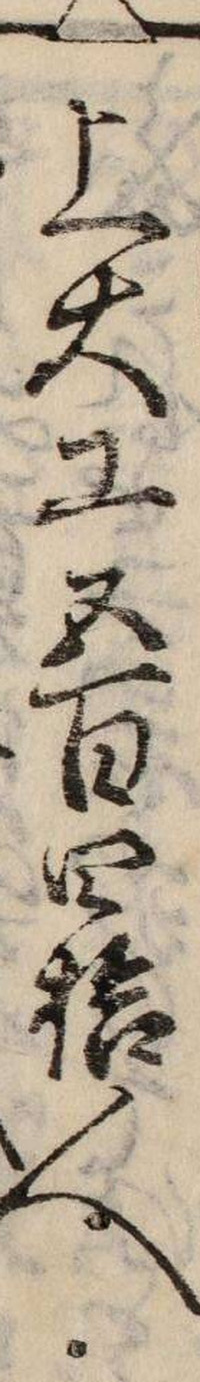△上大工五百四拾人
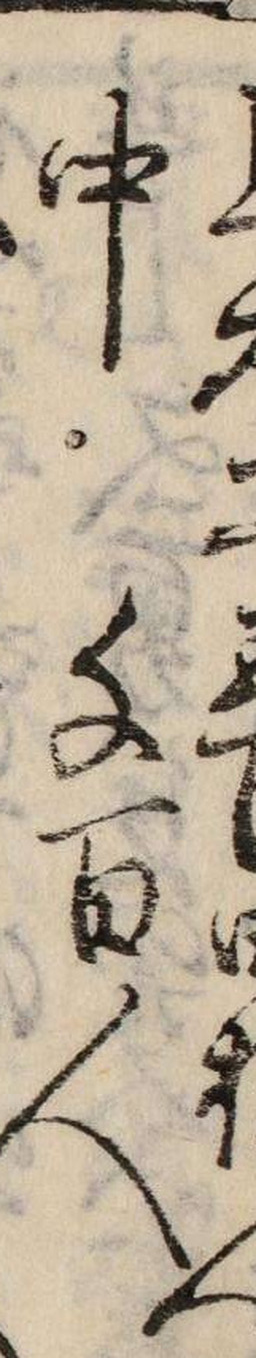中千百人
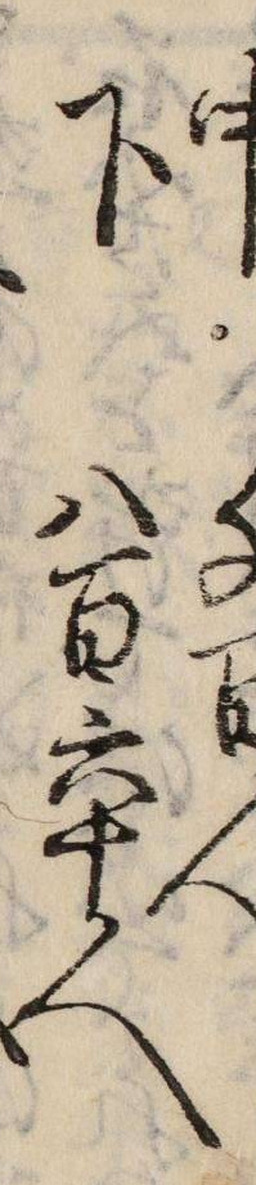下八百六十人
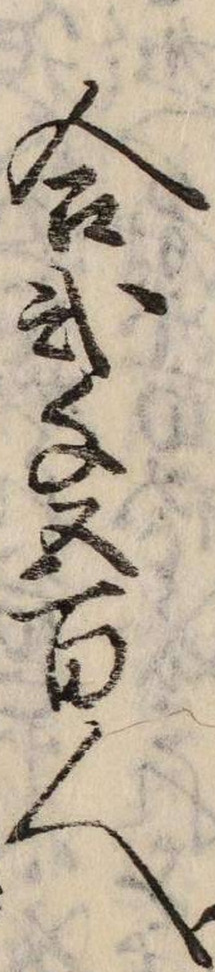合弐千五百人
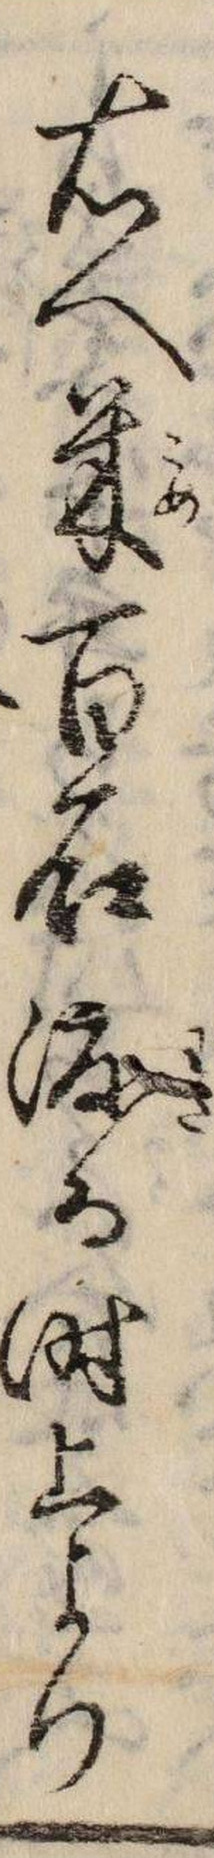右へ米百石渡る時上より
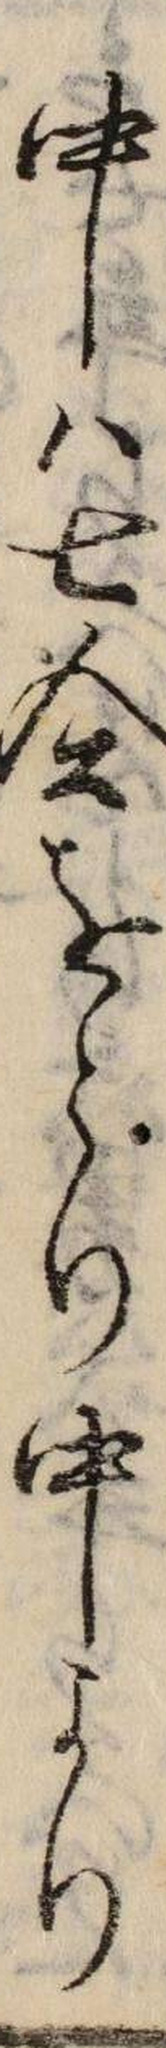中は七合をとり中より
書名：塵劫記（寛永11年自跋、京都府立京都学・歴彩館追貴8）
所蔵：京都府立京都学・歴彩館 国文学研究資料館
